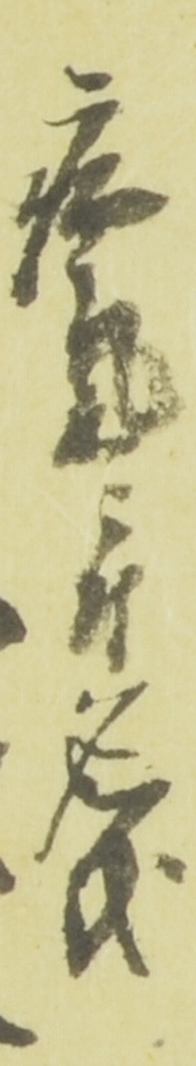病気ニ付名代
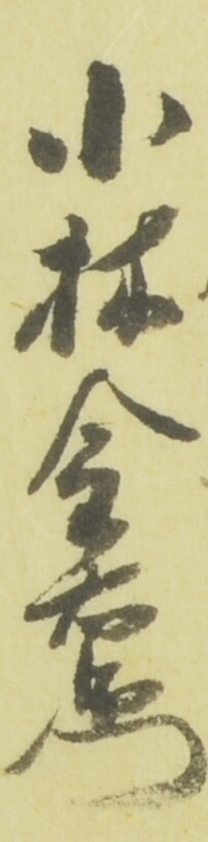小林金右衛門
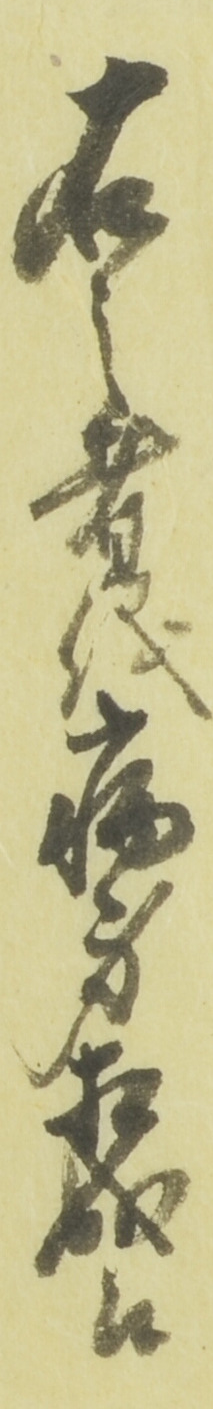右之者儀病身相成候
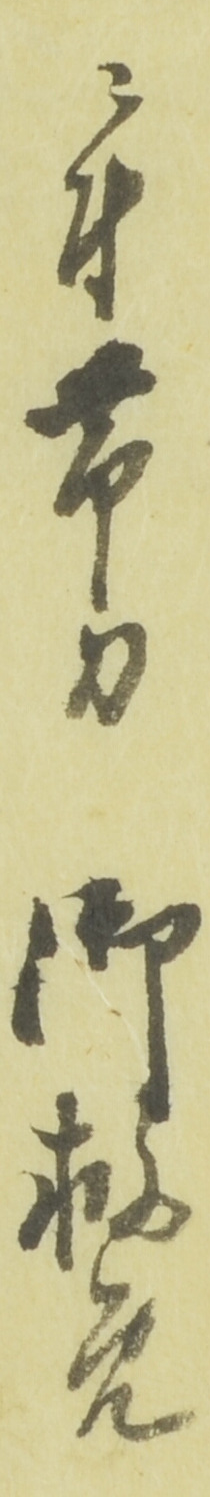ニ付帯刀御救免
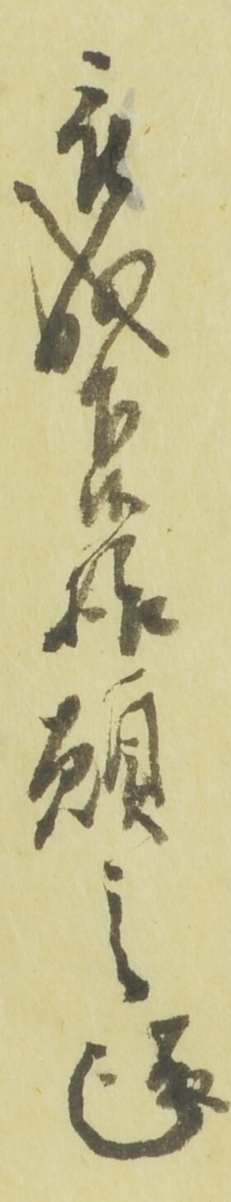被成下候様願之趣
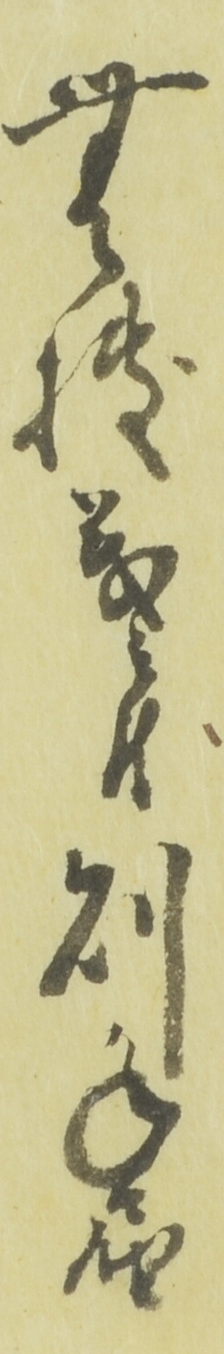無拠義ニ付則承届
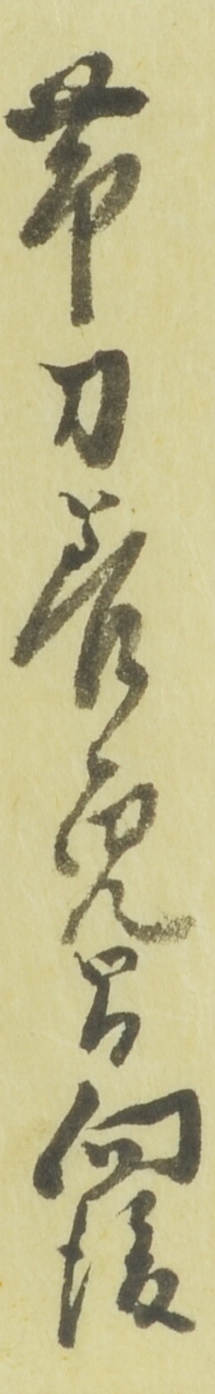帯刀差免間向後
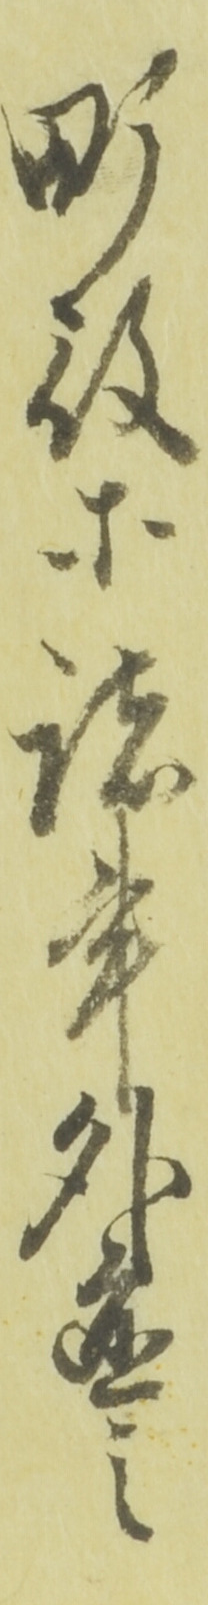町役等諸事外並之
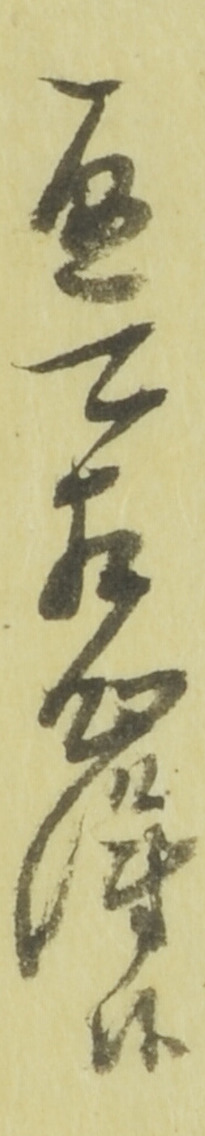通可相心得候
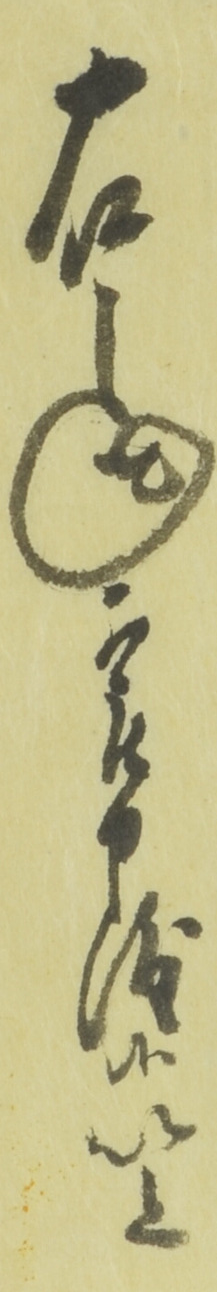右之趣可被申渡候以上
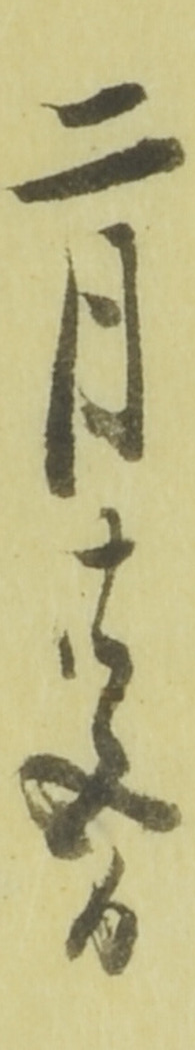二月廿五日
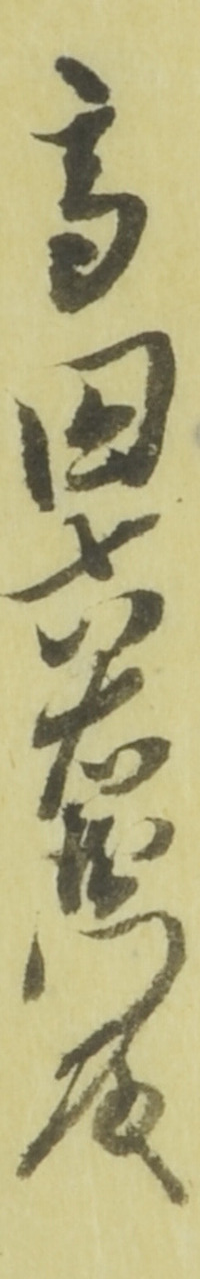高田六右衛門殿
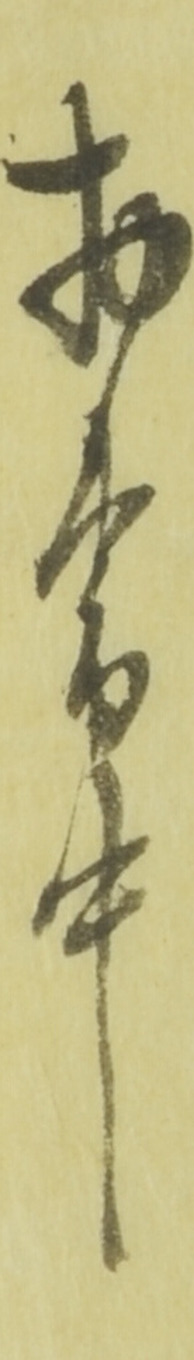物書中

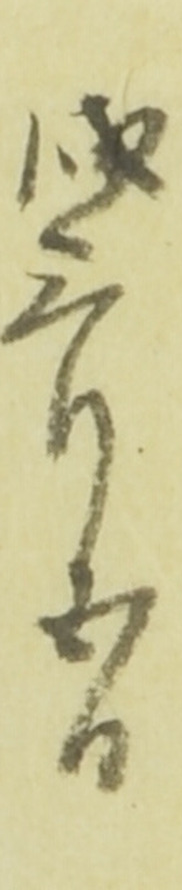戌三月五日
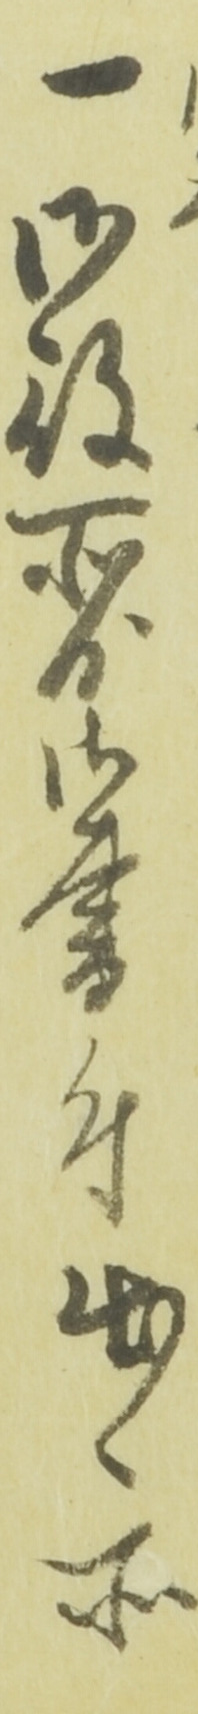一御役所ゟ御書付出候所
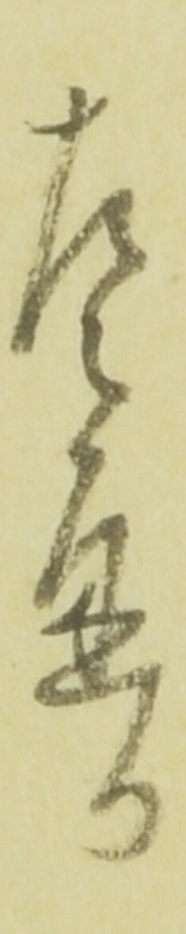左之通り
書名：御触書御書附控
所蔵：伊那市立高遠町図書館・合同会社AMANE
